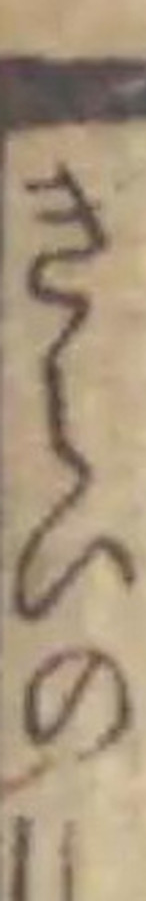きらいの
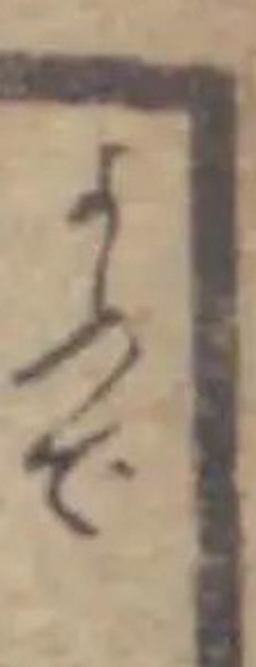よふで
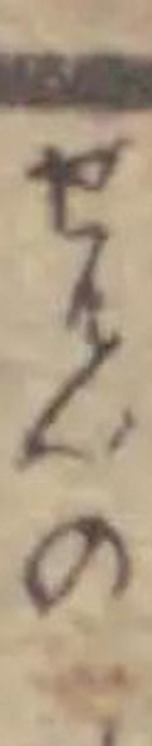せけんの
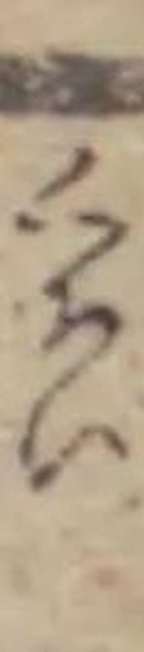くはい
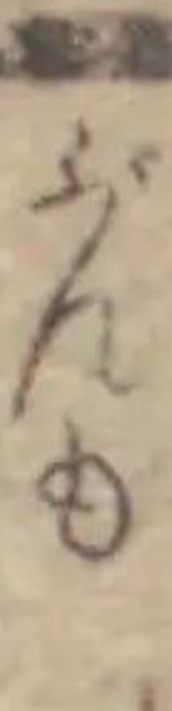ぐんも
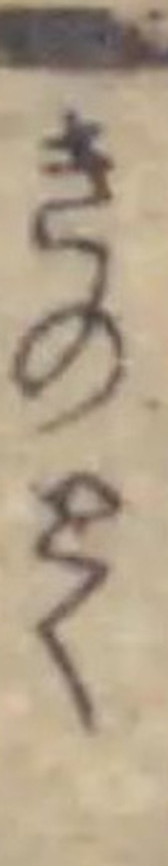きのとく
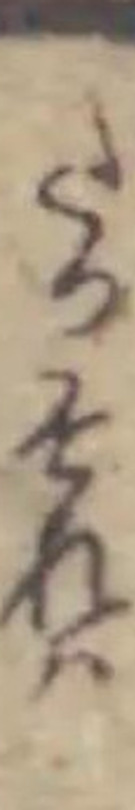だかそれは
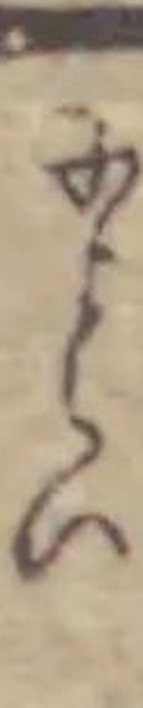によらい
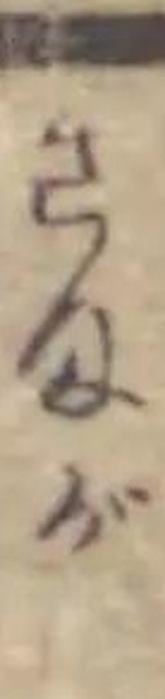さまが
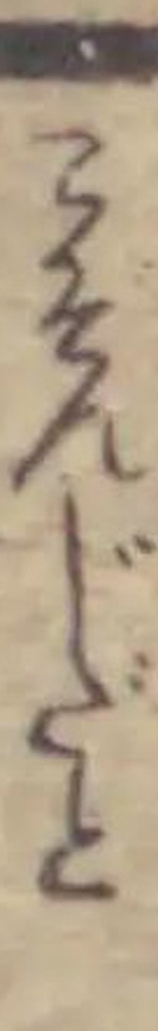こぞんじだと
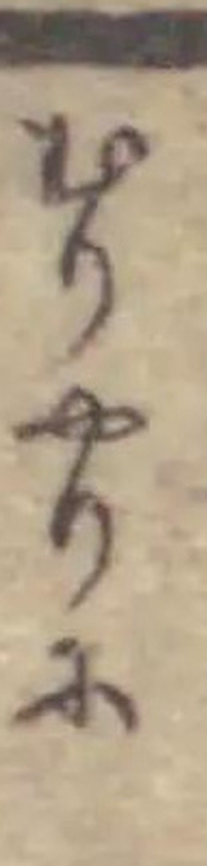むりやりに
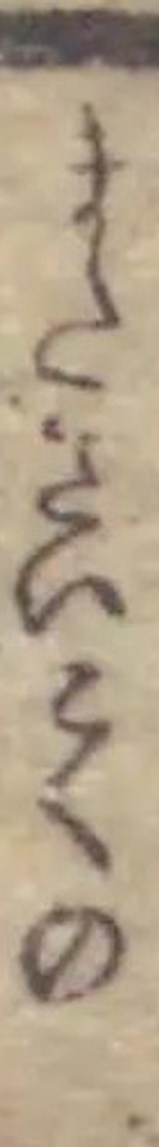またさいこくの
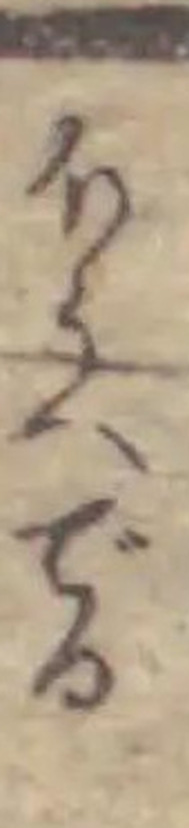ほうへでる
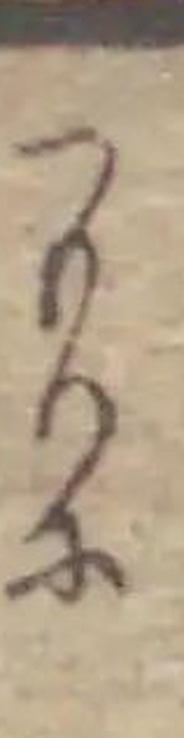つもりに
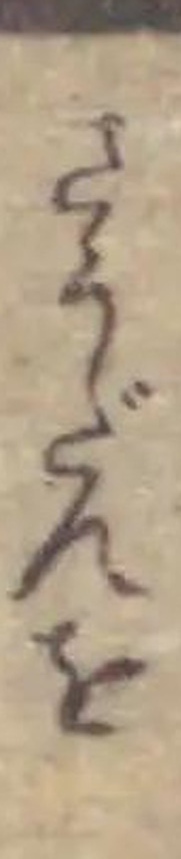さうだんを
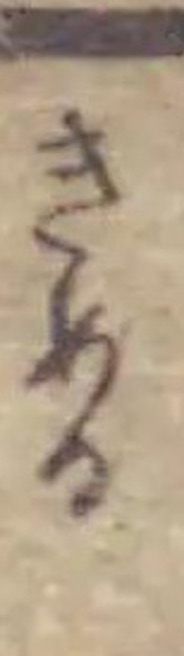きめる
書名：もふもふもふ怖噺 2巻
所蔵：国立国会図書館 National Diet Library, JAPAN
